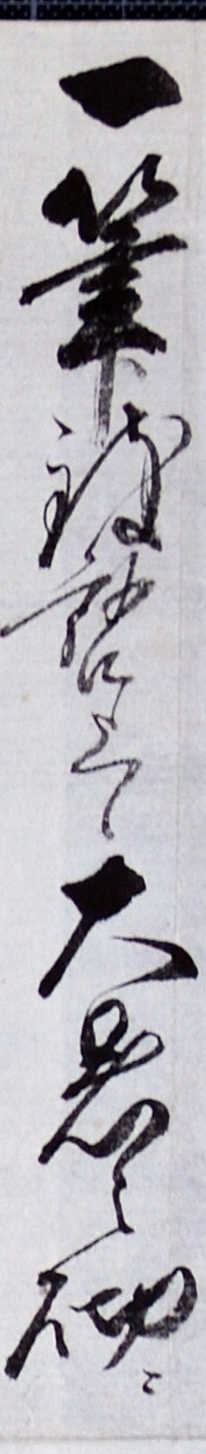一筆致啓上候大暑之砌ニ
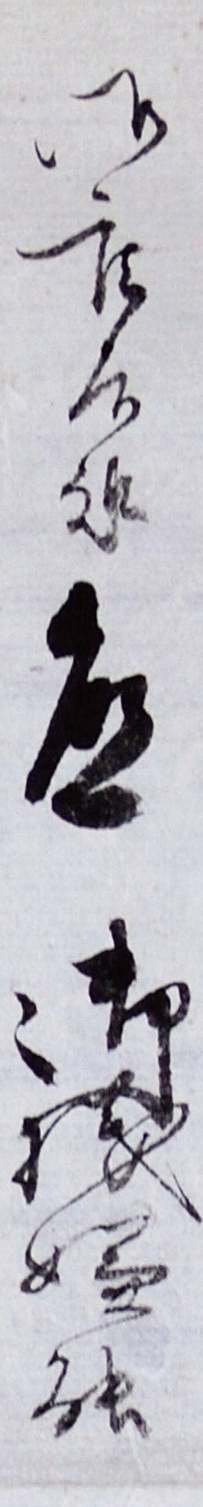御座候趣常御機嫌能
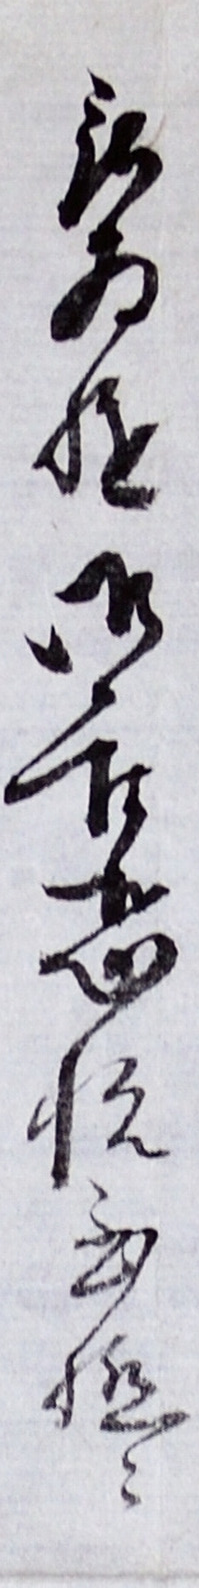被為遊御座恐悦至極ニ
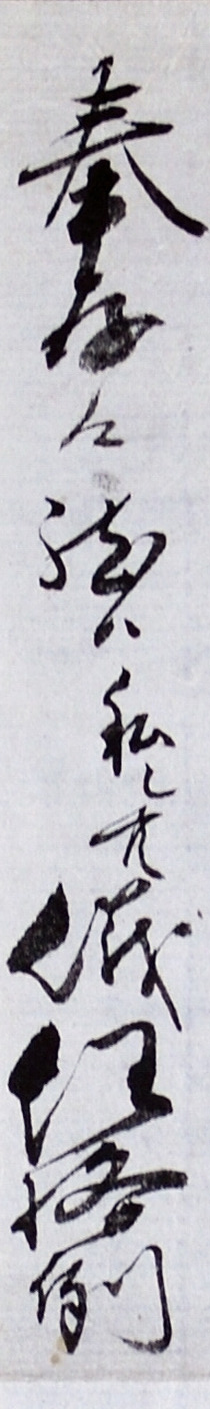奉存候然ハ私シ共儀任格例
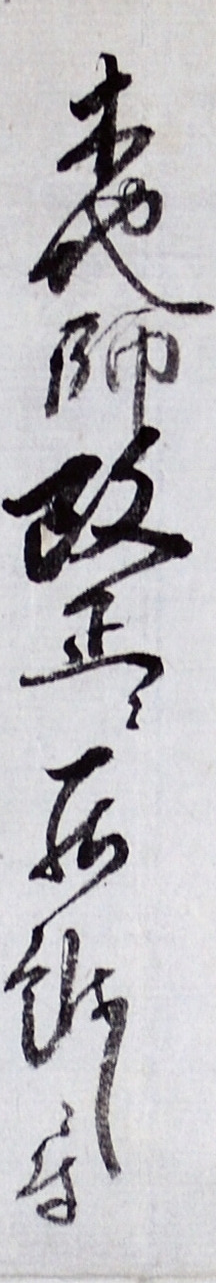木地師改正ニ罷越候ニ付
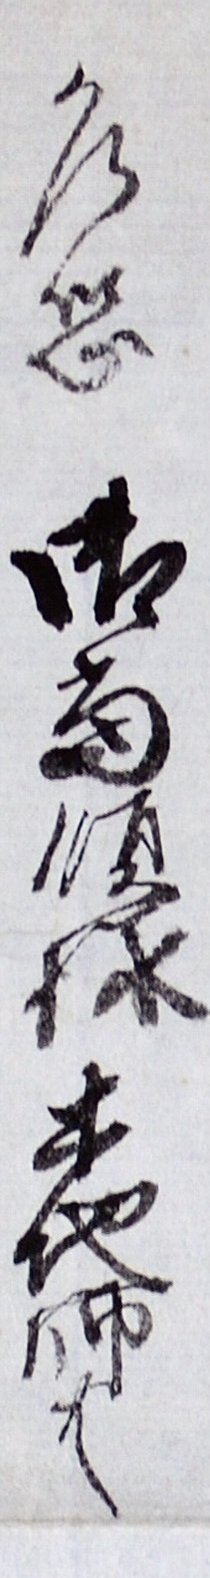乍恐御当領様木地師共
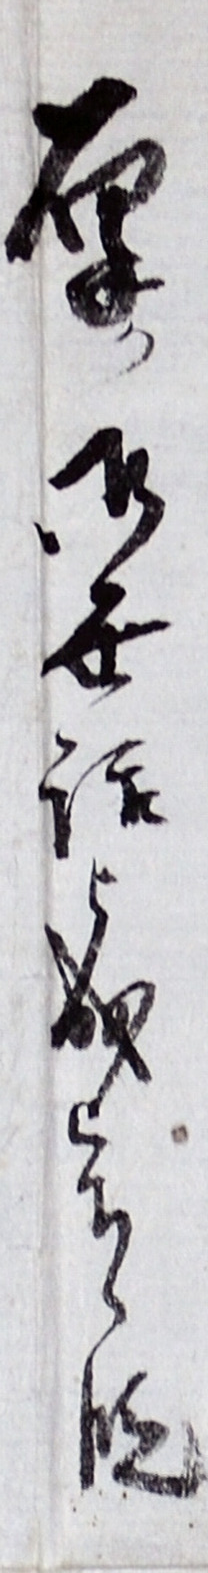厚ク御世話被成被下候段
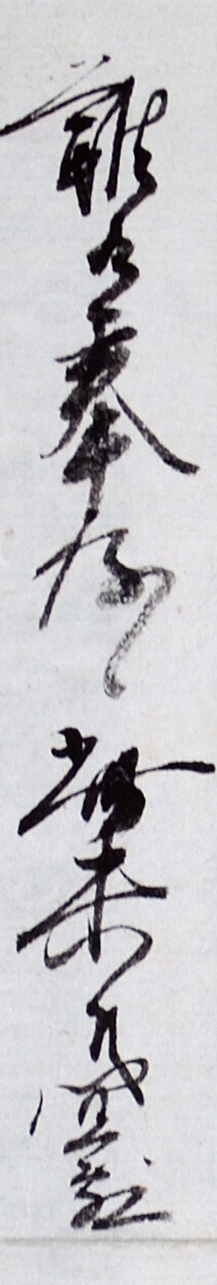難有奉存候此末共宜敷
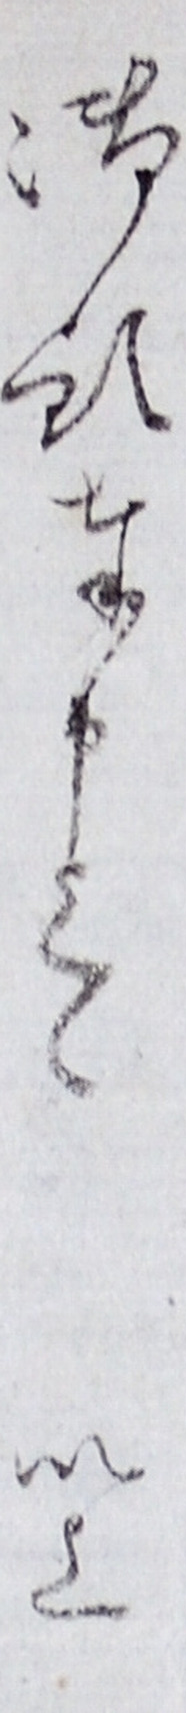御願奉申上候以上
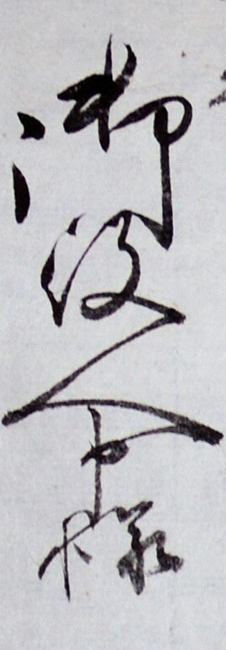御役人中様
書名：書状
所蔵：伊那市立高遠町図書館・合同会社AMANE
